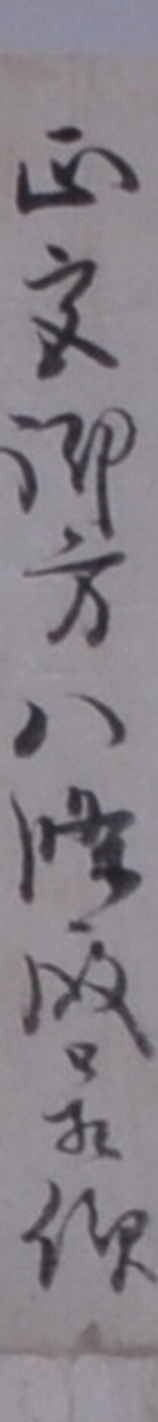正宮御方八條殿御相続
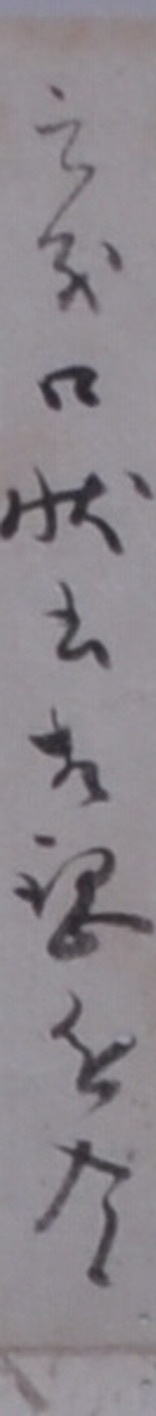之義口状書相整進入候
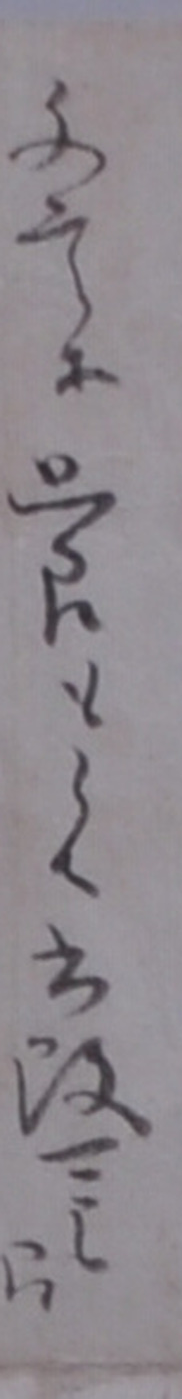文言等思召も候はゝ書改可申候間
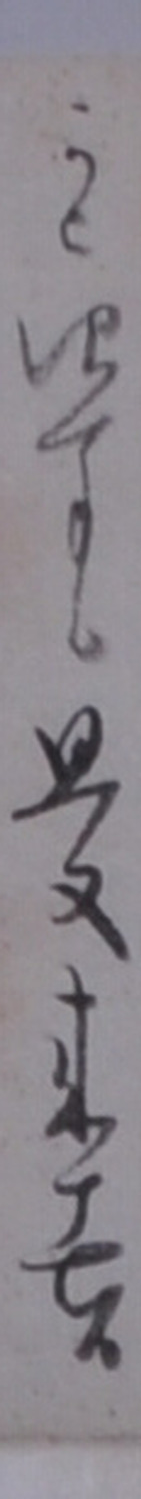可被仰聞候且又来十七日
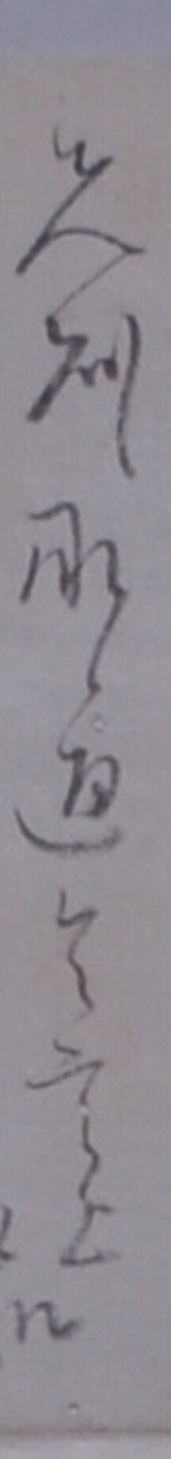先刻承候通令言上候処
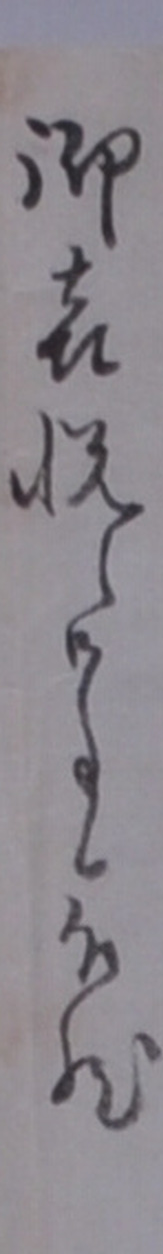御喜悦之御事候乍然
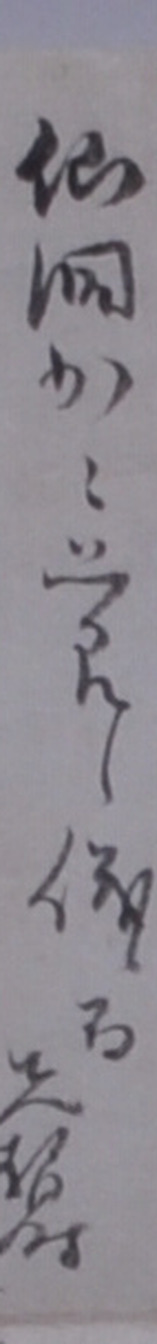仙洞少々思召之儀候間先暫時
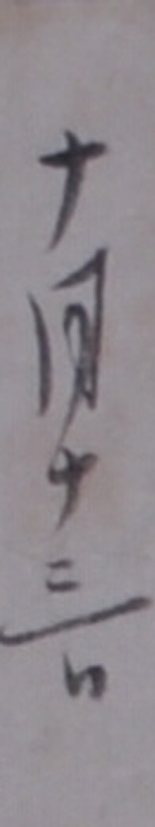十月十三日
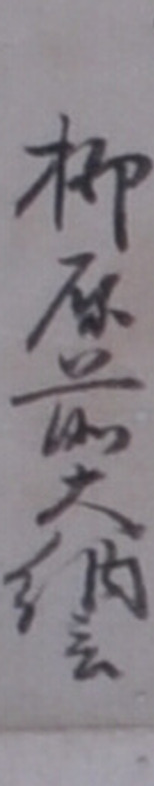柳原前大納言
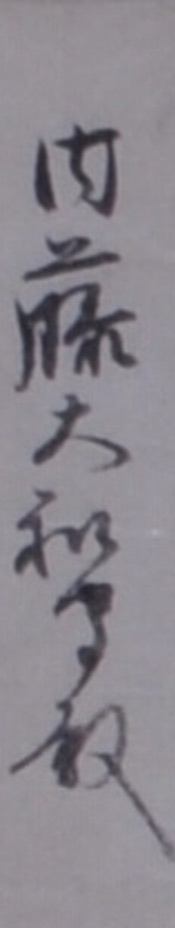内藤大和守殿
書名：書状
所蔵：伊那市立高遠町図書館・合同会社AMANE
